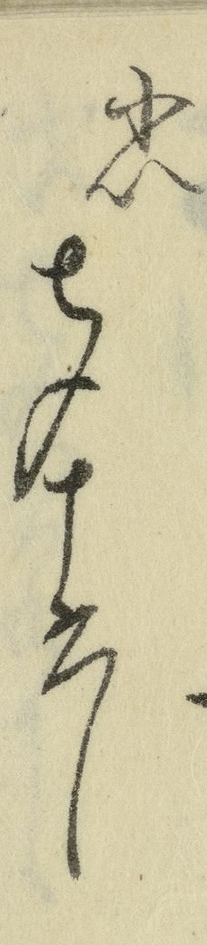小以七〆十六文

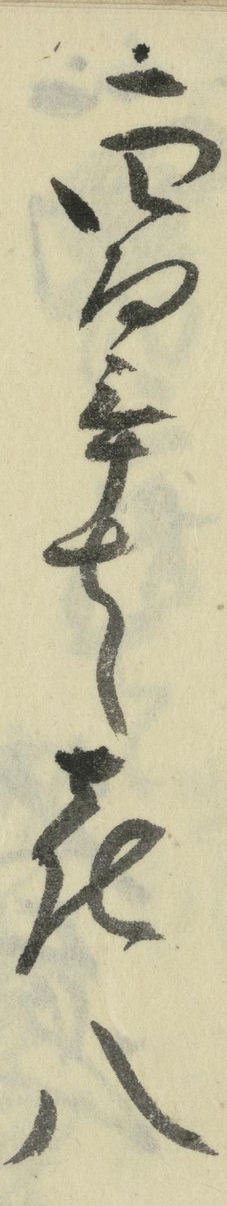一四百三十七文喜八
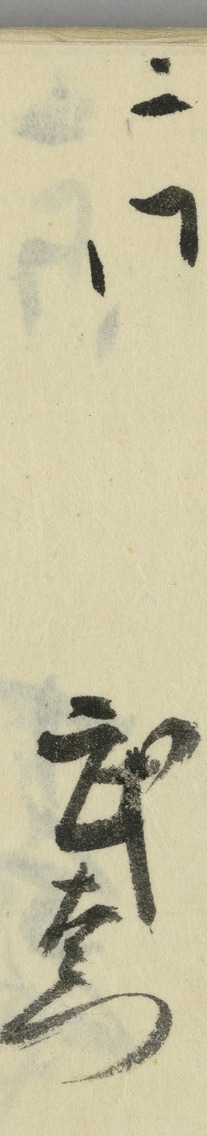一同武右衛門
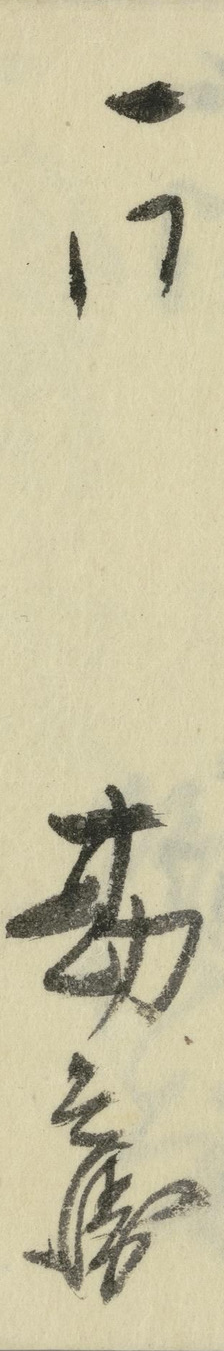一同勘兵衛
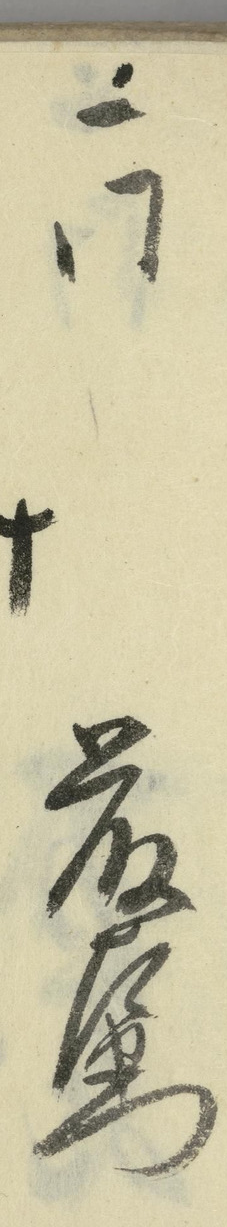一同武右衛門
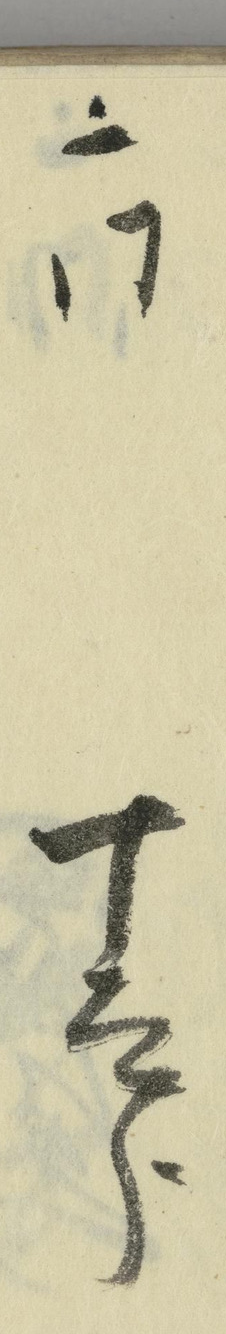一同吉太郎

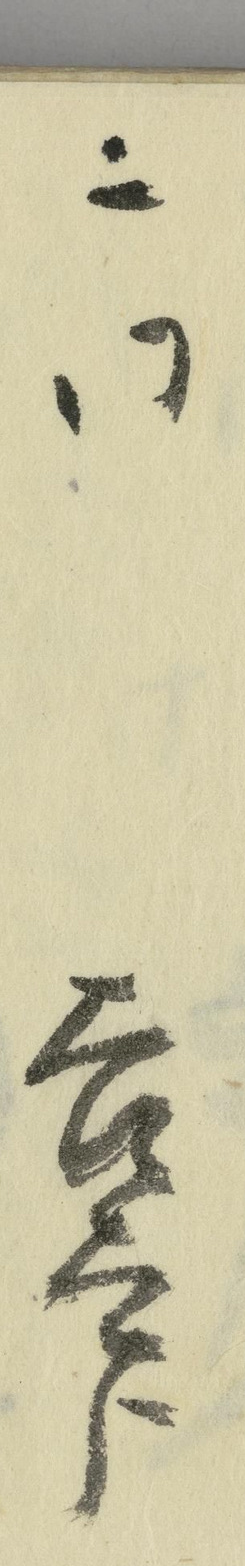一同兵右衛門
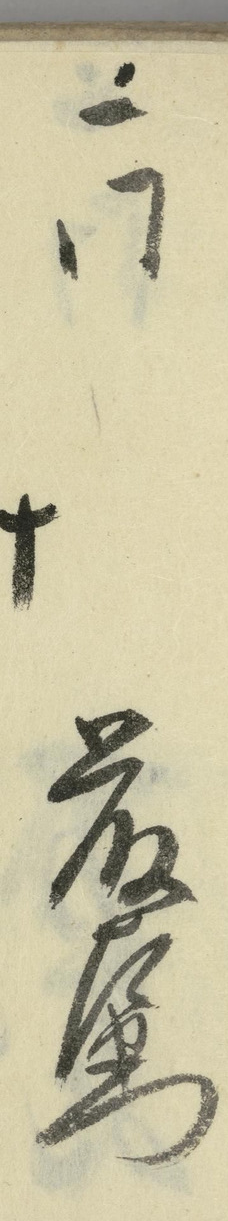一同藤左衛門
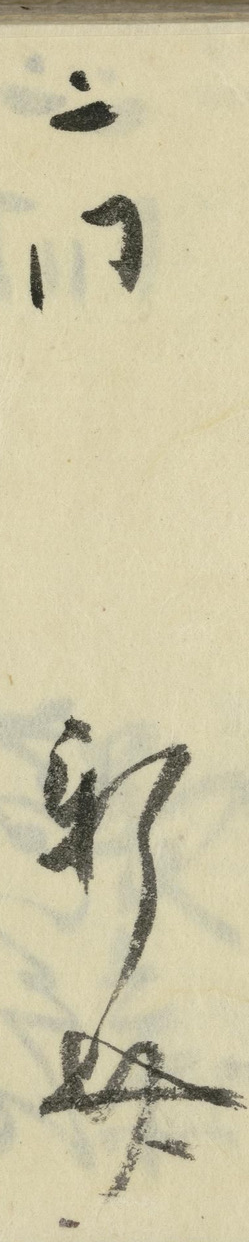一同新介
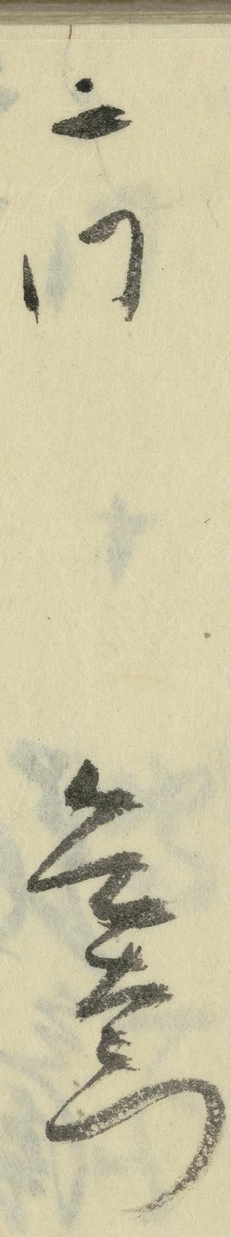一同兵右衛門
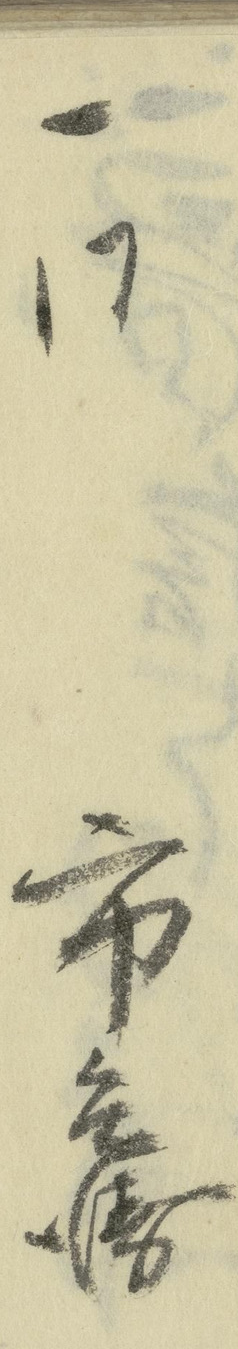一同市兵衛

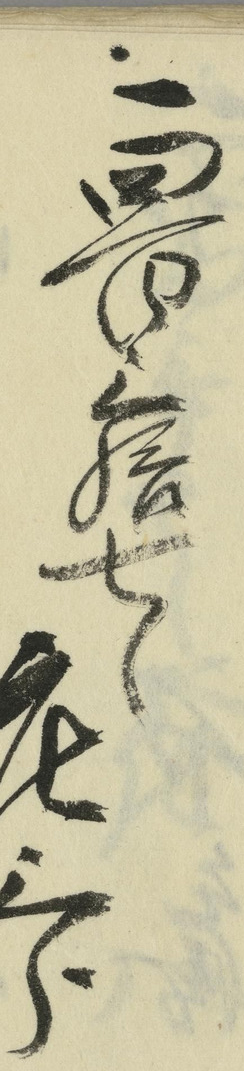一四百三拾七文庄三郎
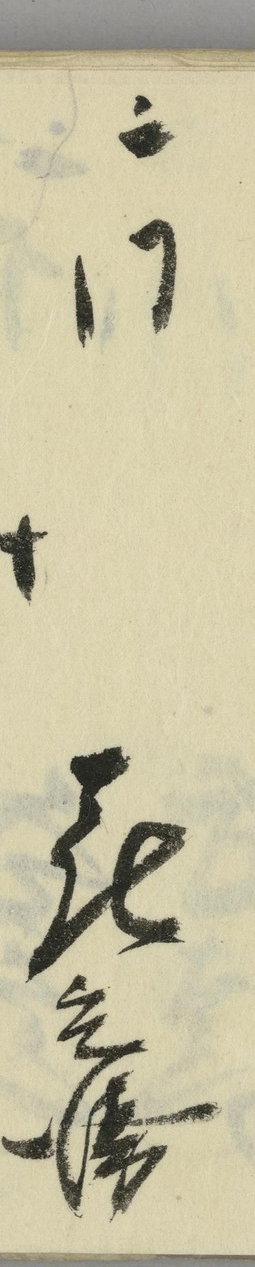一同喜兵衛

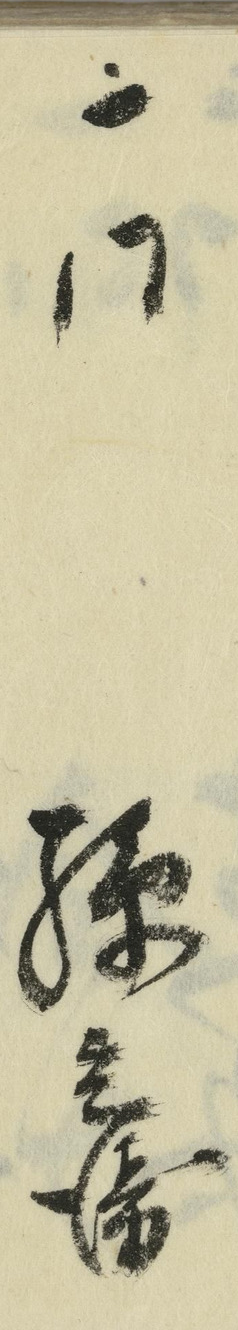一同孫兵衛
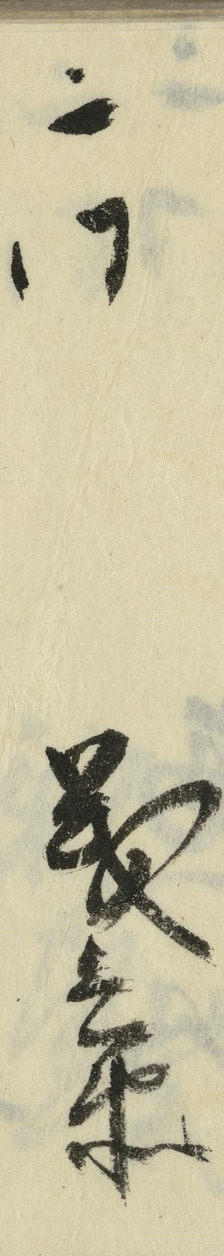一同孫兵衛
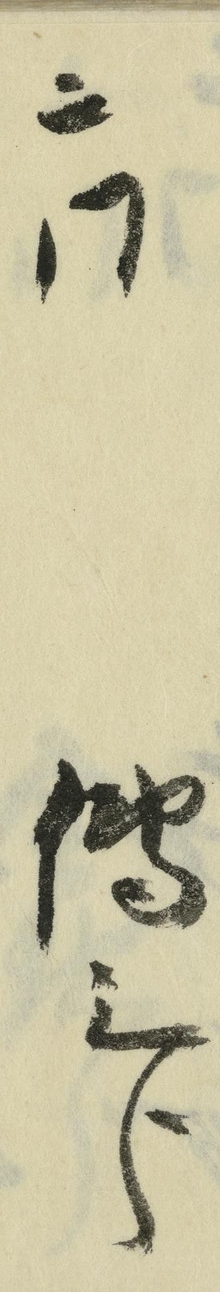一同伝三郎
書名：天明淺間噴火ニ関スル書類
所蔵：東京大学地震研究所図書室 Earthquake Research Institute Library, The University of Tokyo, JAPAN
